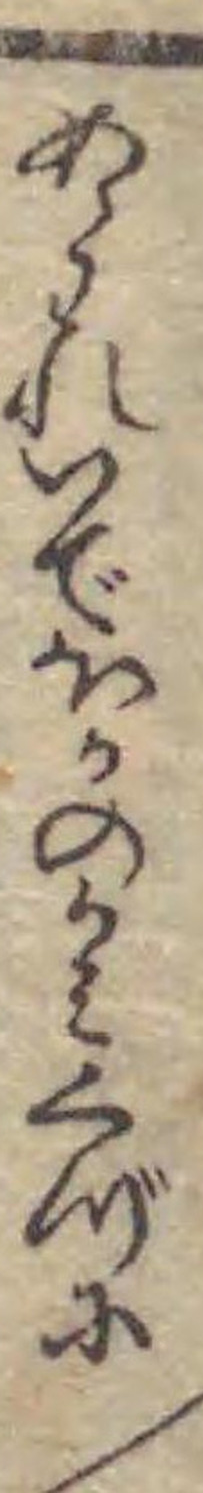あらわれいでほかのかみくづに
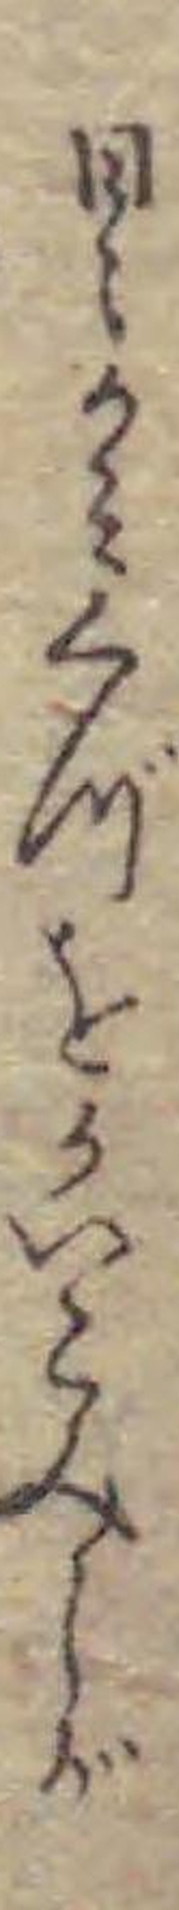日〻かみくづをかいこみしが
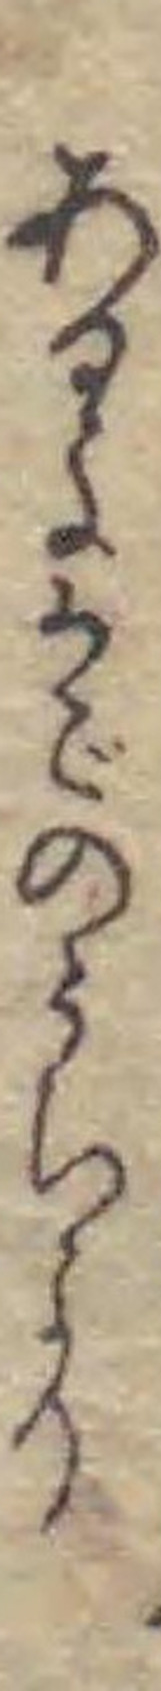あるよかどのうちより
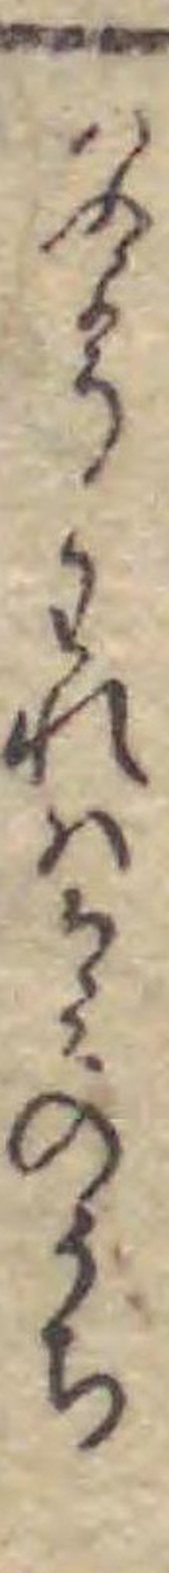いふようわれはかみのうち
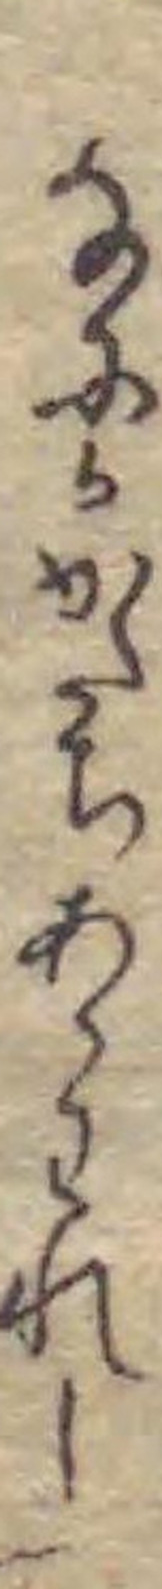なにかかたちあらわれし
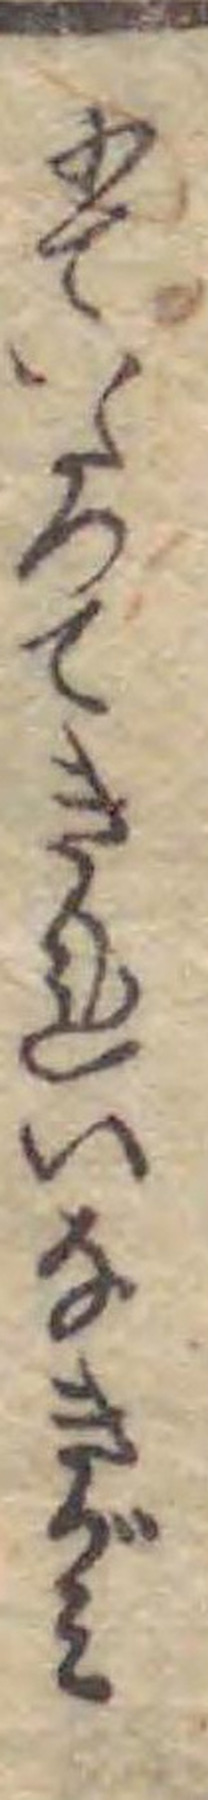にていたつてきれいなきがみ
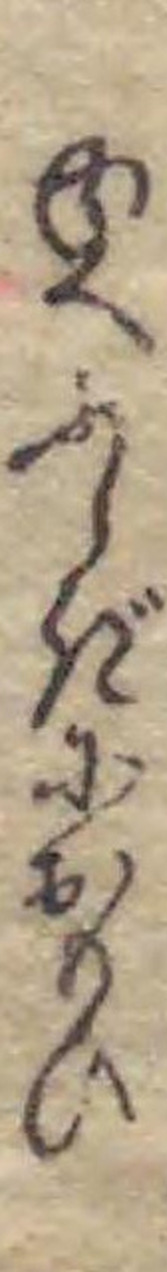ゆへふしぎにおもひ
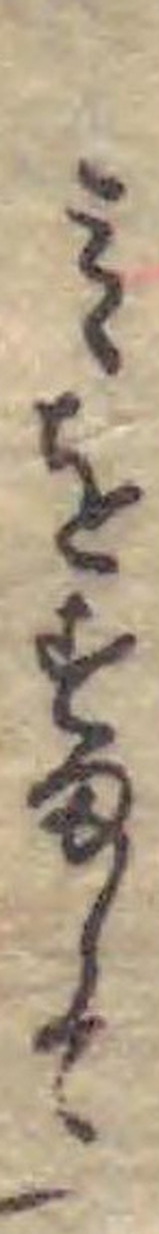みゝをすまして
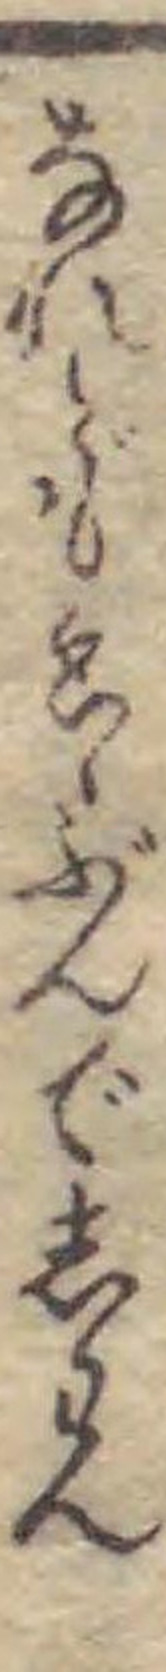なれともゑゝぶんでしわん
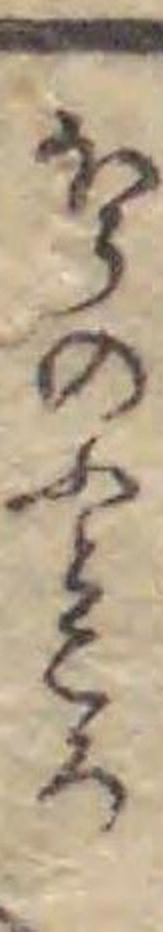ほうのふところ
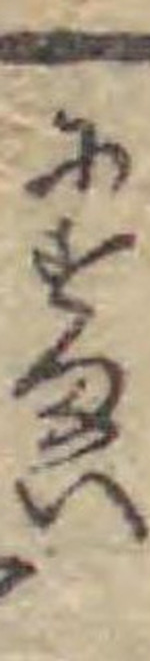にすまい
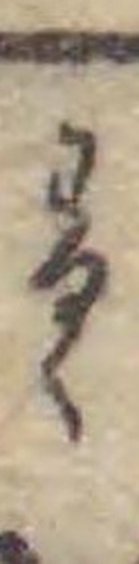わるく
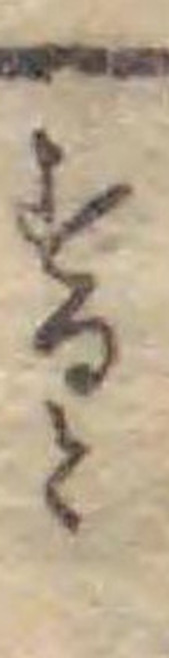すると
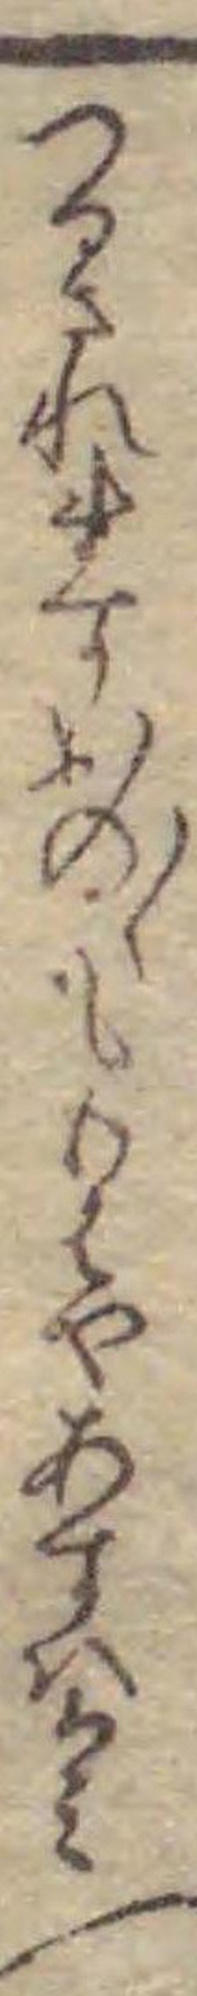つるされますおの〳〵ももはやあすはかみ
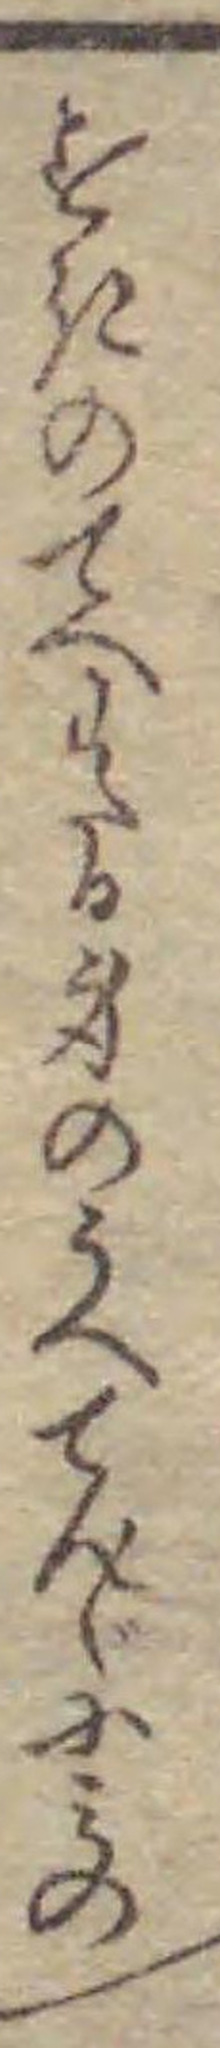すきのてへわたる身のうへてん〴〵にみの
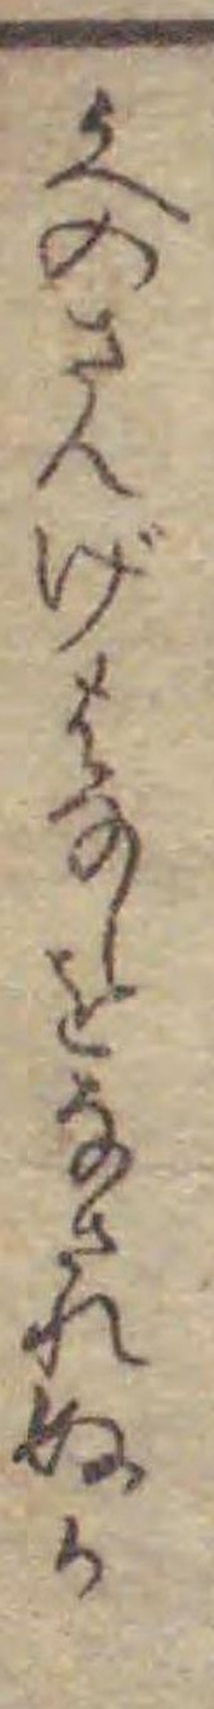うへのさんげはなしをなされぬか
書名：紙屑身上噺 : 3巻
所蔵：国立国会図書館 National Diet Library, JAPAN
